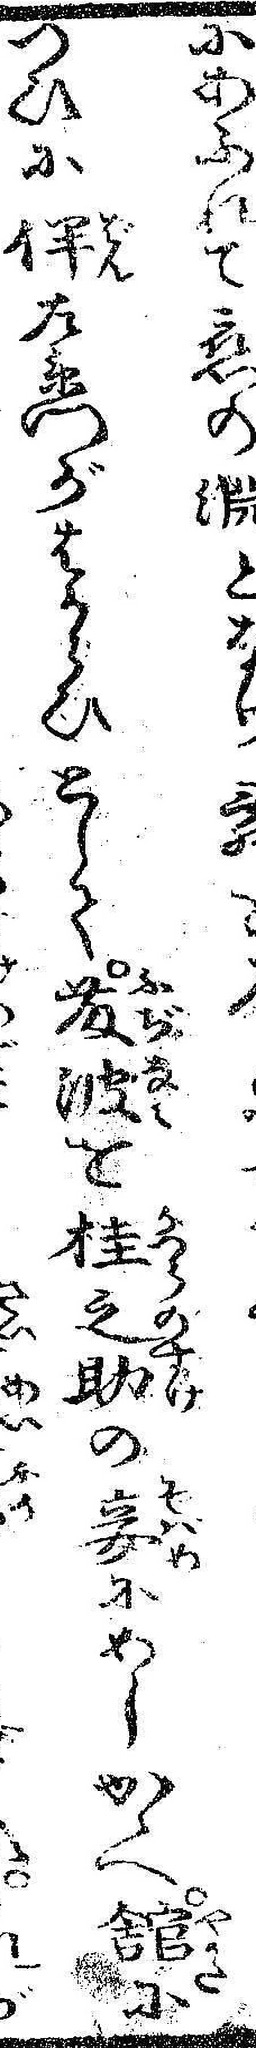つひに伴左衛門がはからひとして。藤波を桂之助の妾にめしかゝへ。館に
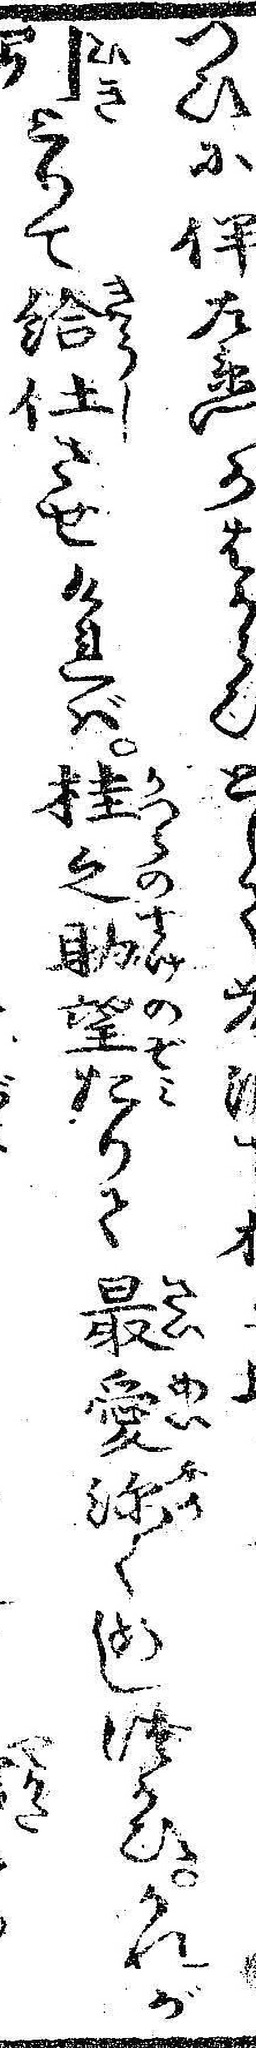引とりて給仕させければ。桂之助望たりて最愛深くめかしつかひ。かれが
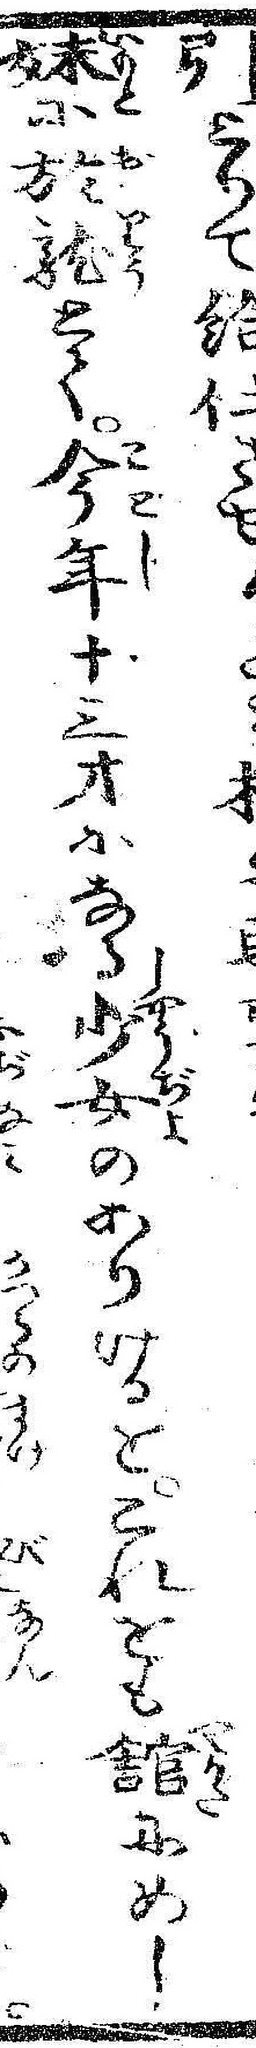妹に於竜とて。今年十三才になる少女のありけるを。これをも館にめし
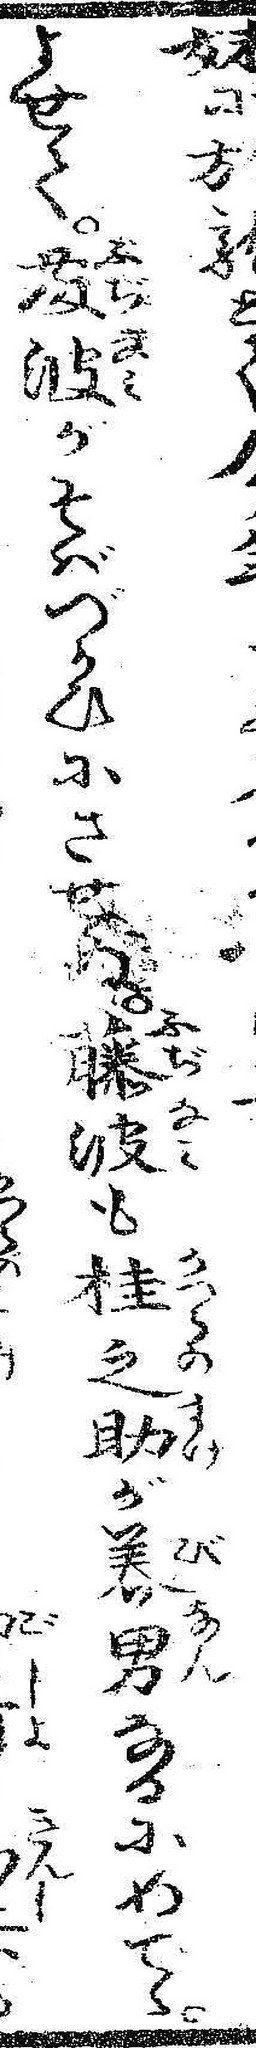よせて。藤波がそばづかひにさせぬ。藤波も桂之助が美男なるにめてゝ
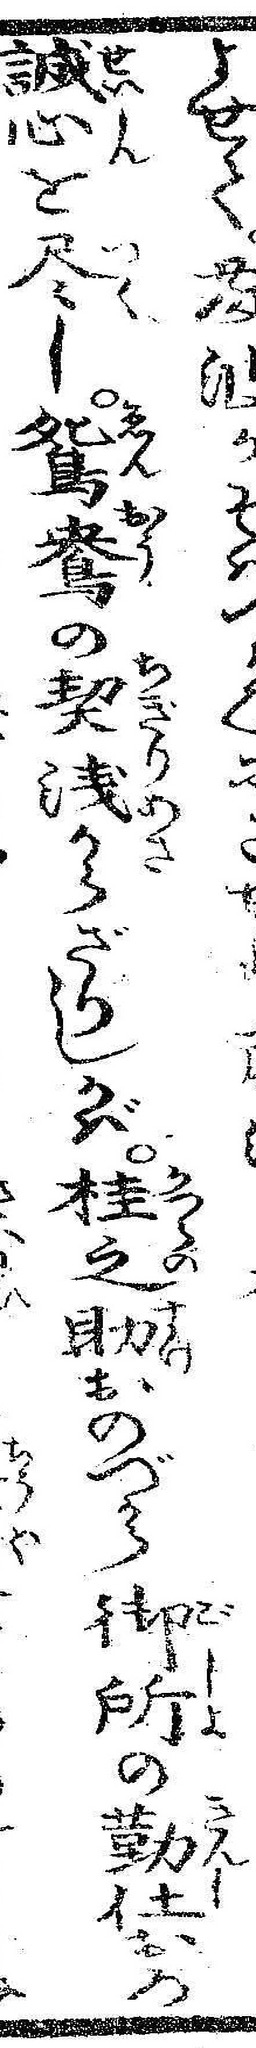誠心を尽し。鴛鴦の契浅からざりしかば。桂之助おのづから御所の勤仕おろ
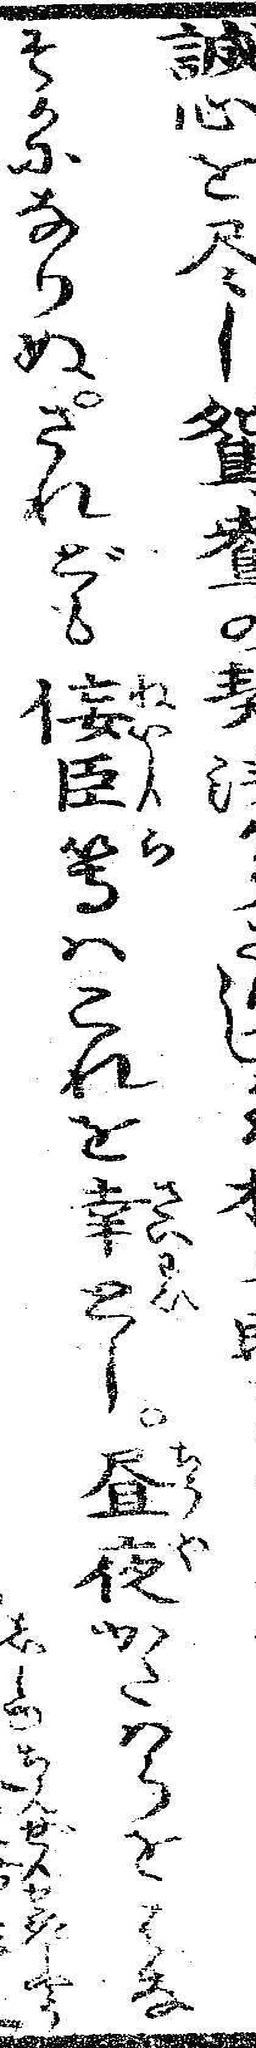そかになりぬ。されども佞臣等はこれを幸とし。昼夜かたわらをはな
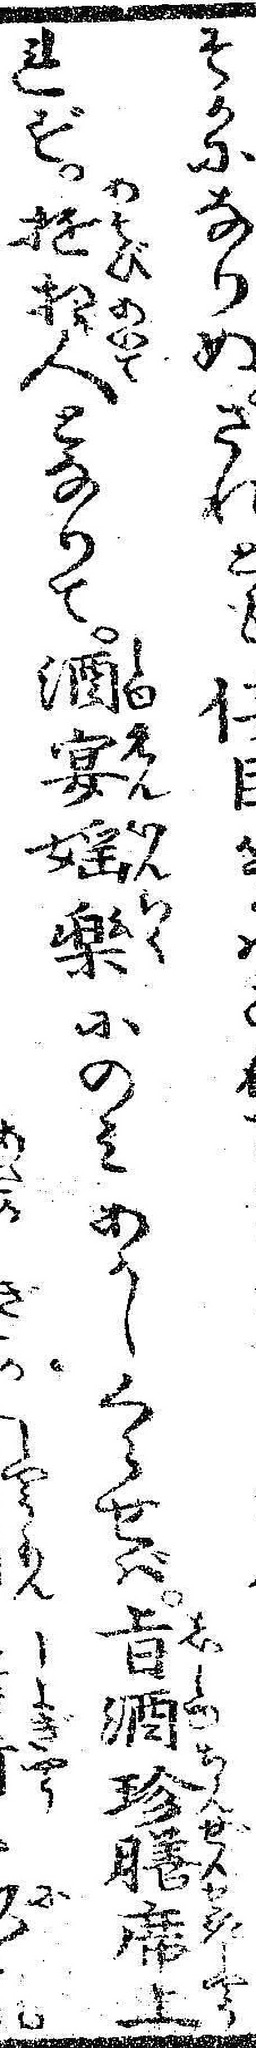れず。遊相人となりて。酒宴婬楽にのみあかしくらせば。旨酒珍膳席上
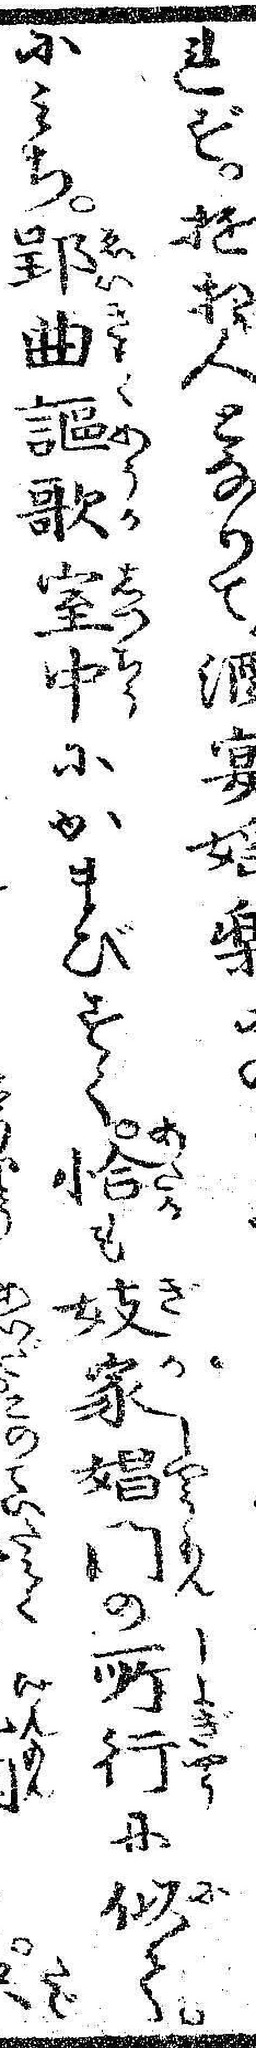にみち。郢曲謳歌室中にかまびすく。恰も妓家娼門の所行に似て。
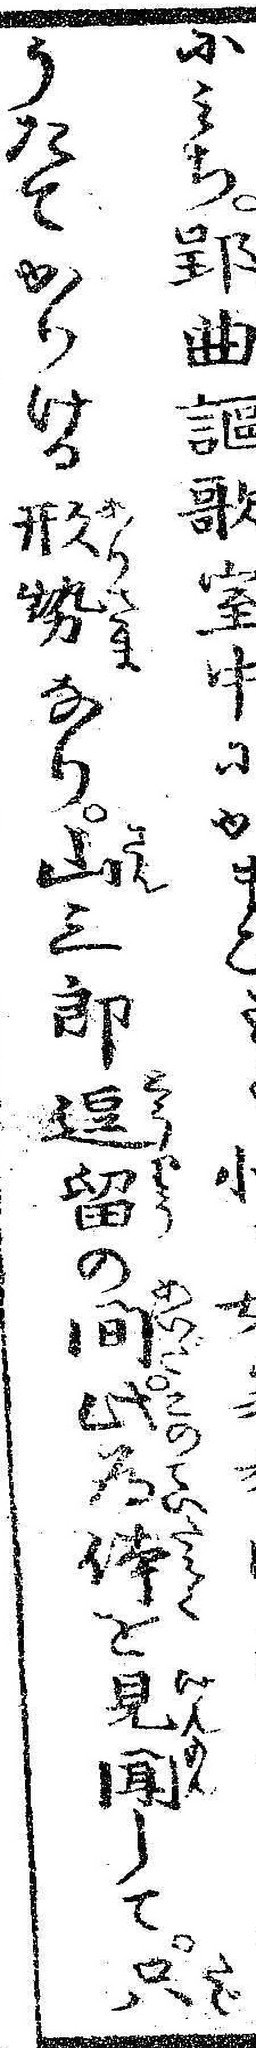うたてかりける形勢なり。山三郎逗留の間。此為体を見聞して。只

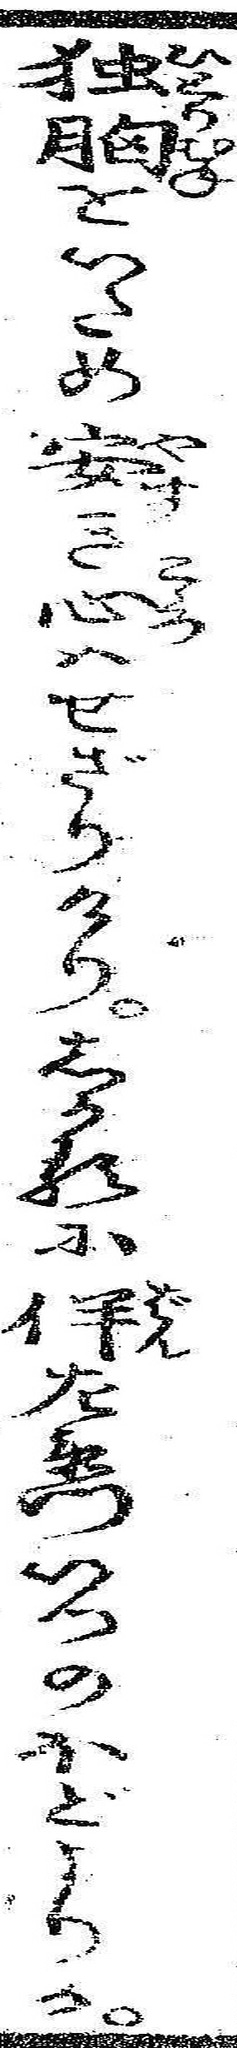独胸をいため安き心はせざりけり。しかるに伴左衛門いつのほどよりか。
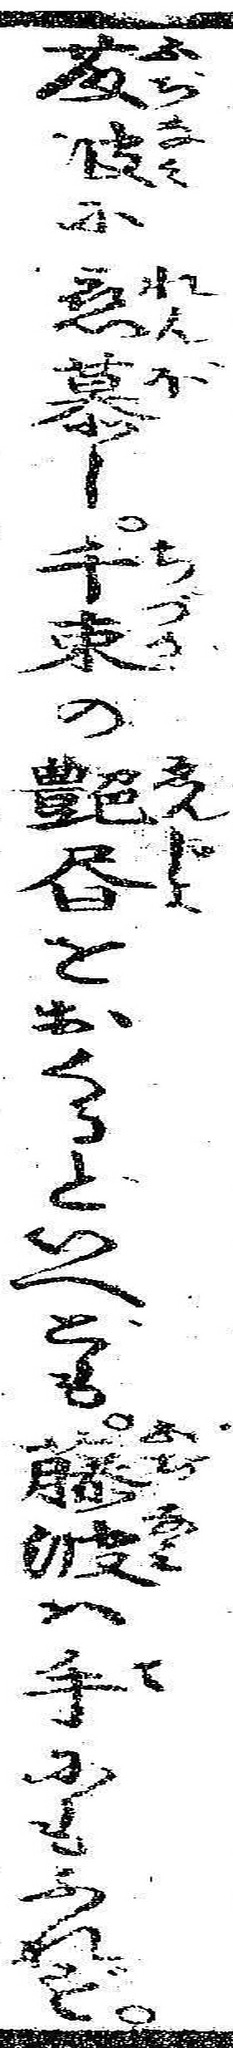藤波に恋慕し。千束の艶書をおくるといへども。藤波は手にもふれず。
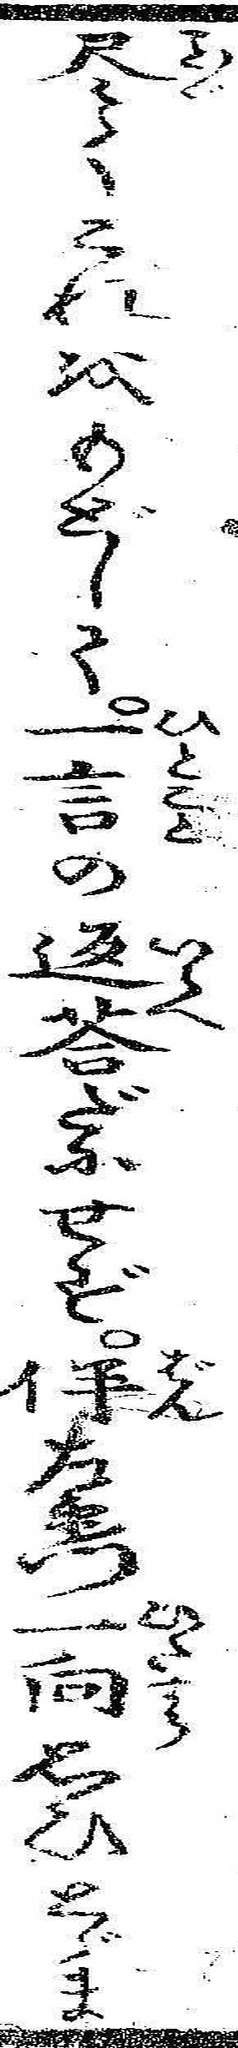尽くこれをもどして。一言の返荅だにせず。伴左衛門一向思ひとゞま
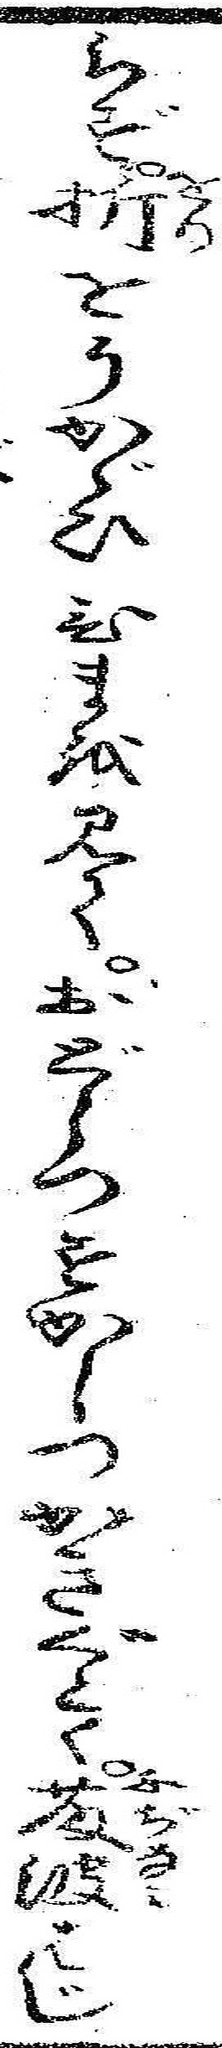らず。折をうかゞひひまを見て。おどしつすかしつかきぐとく。藤波はじ
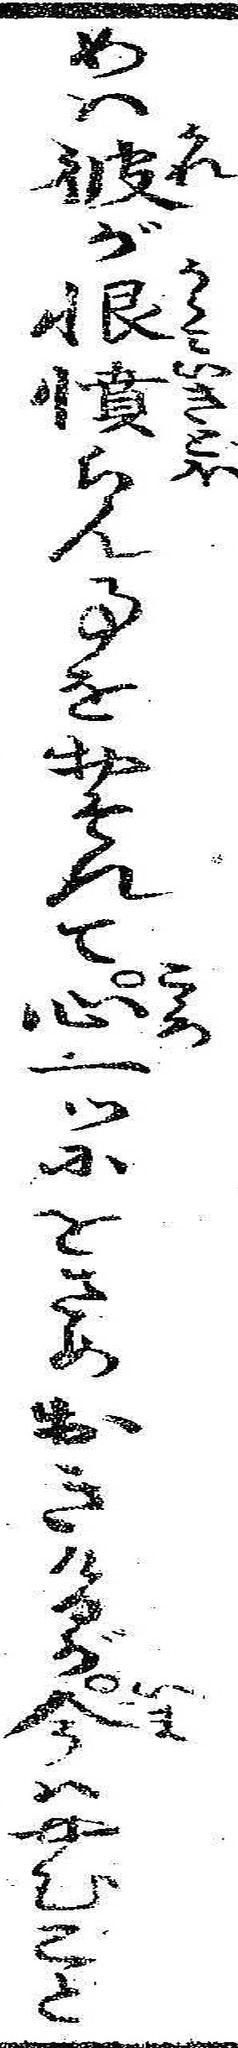めは彼が恨憤らん事をおそれて。心一ツにをさめおきけるが。今はやむこと
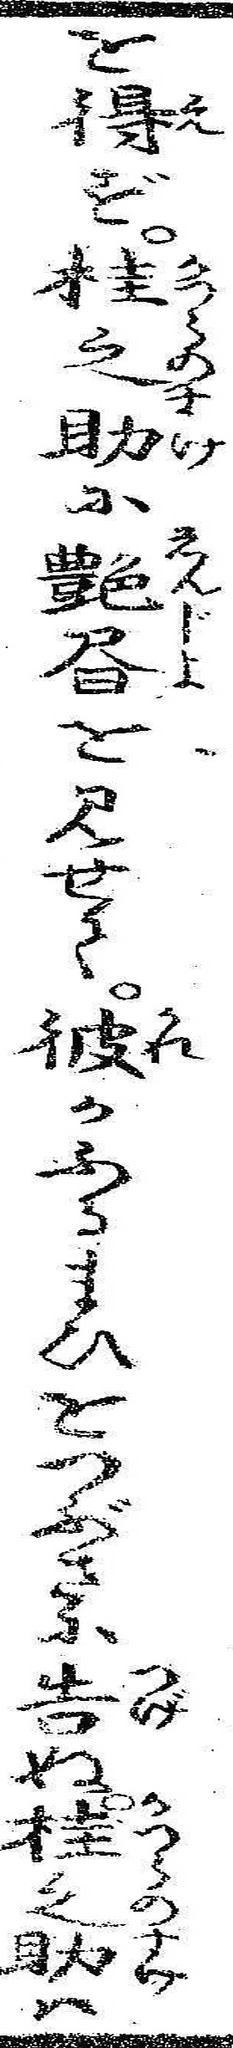を得ず。桂之助に艶書を見せて。彼かふるまひをつぶさに告ぬ。桂之助は
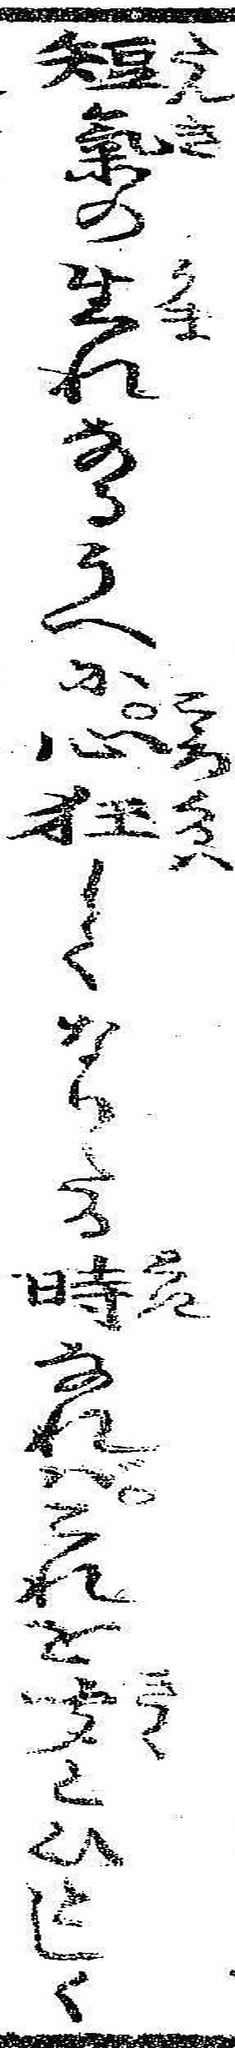短気の生れなるうへに。心狂しくなりたる時なれば。これを聞とひとしく
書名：昔話稲妻表紙
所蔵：国文学研究資料館
